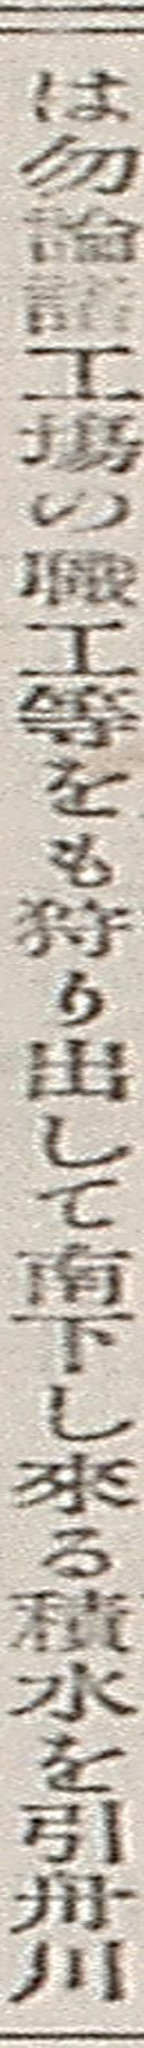は勿論諸工場の職工等をも狩り出して南下し来る積水を引舟川
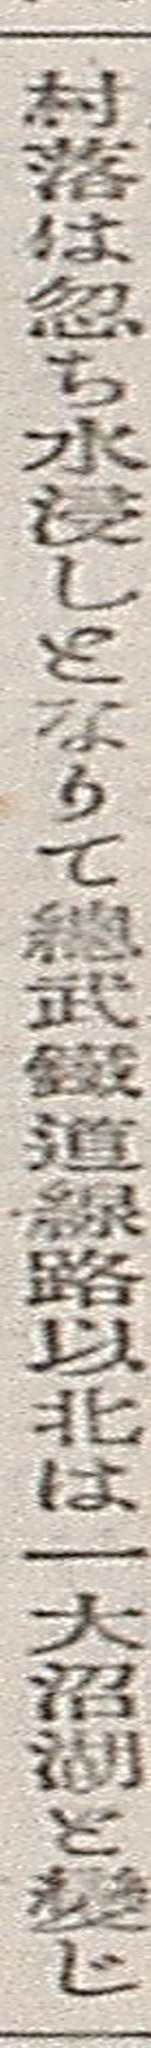村落は忽ち水浸しとなりて総武鉄道線路以北は一大沼湖と変じ
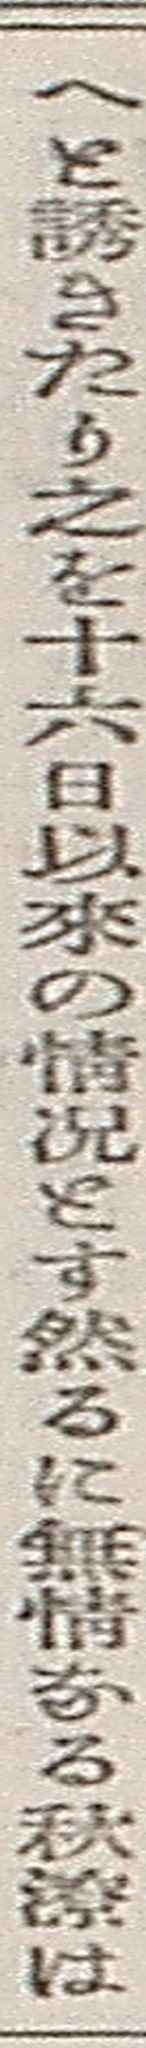へと誘きたり之を十六日以来の情況とす然るに無情なる秋潦は
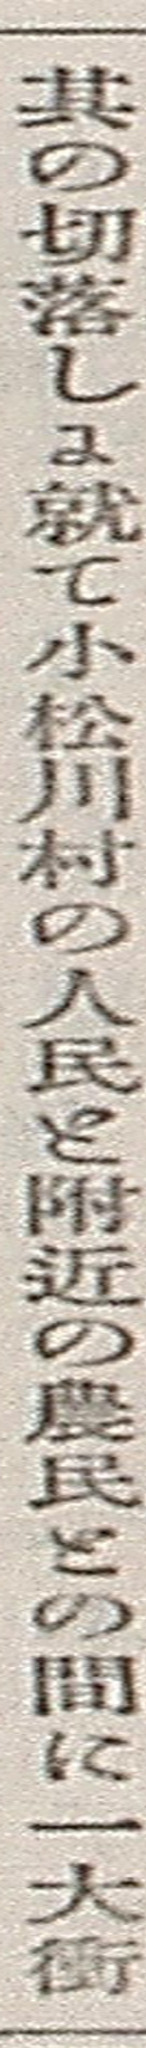其の切落しに就て小松川村の人民と附近の農民との間に一大衝
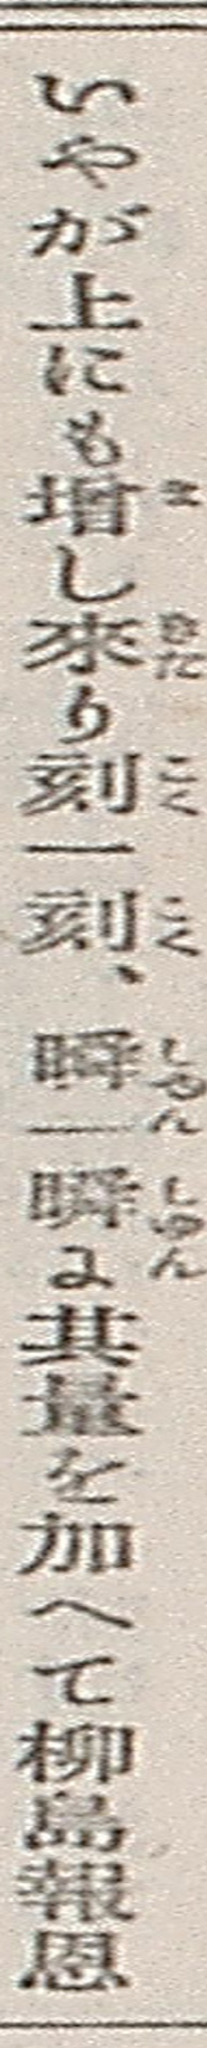いやが上にも増し来り刻一刻、瞬一瞬に其量を加へて柳島法恩
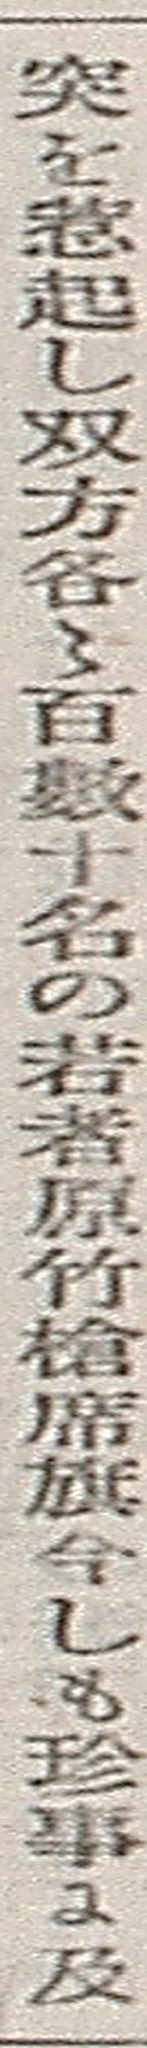突を惹起し双方各々百数十名の若者原竹槍席旗今しも珍事に及
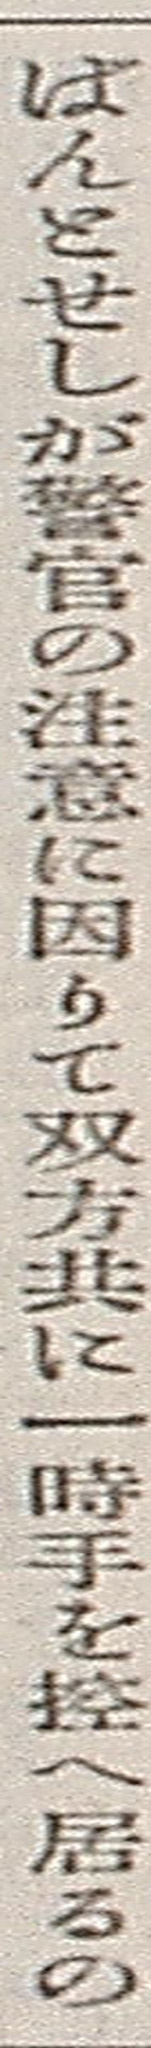ばんとせしが警官の注意に因りて双方共に一時手を控へ居るの
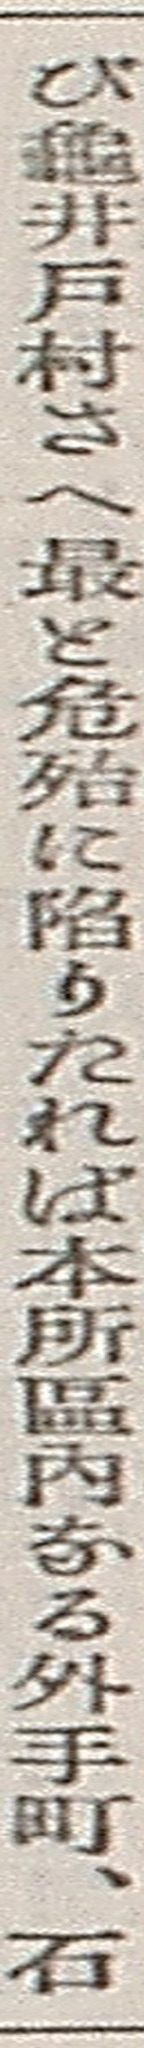び亀井戸村さへ最と危殆に陥りたれば本所区内なる外手町、石
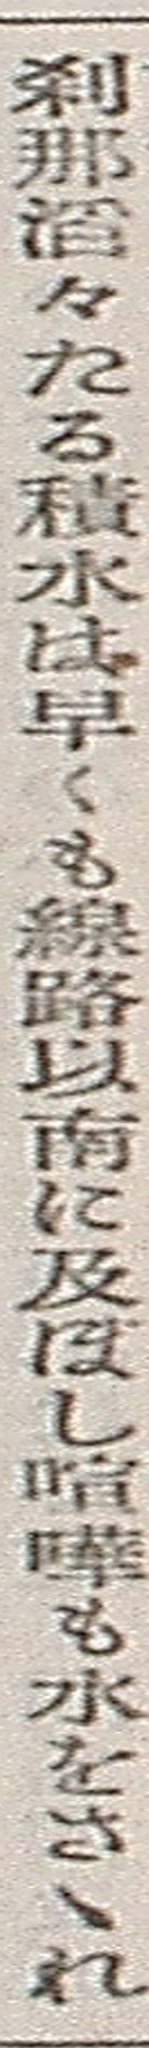刹那滔々たる積水は早くも線路以南に及ぼし喧嘩も水をさゝれ
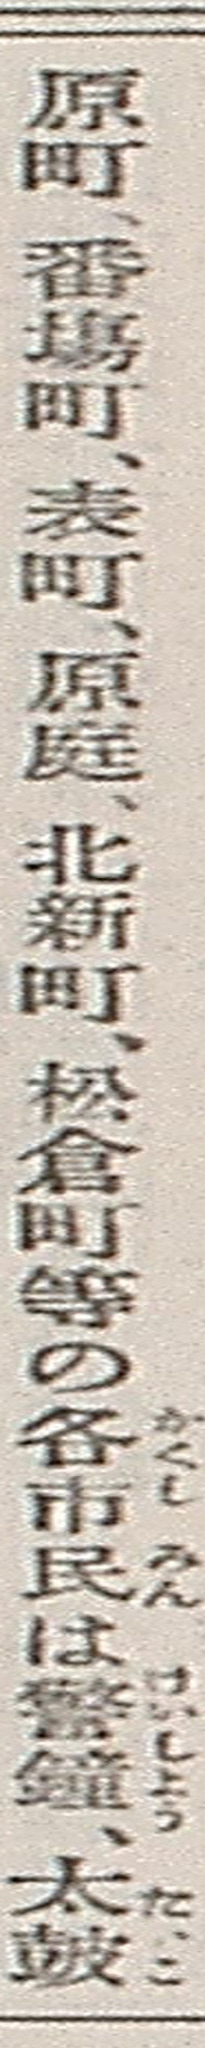原町、番場町、表町、原庭、北新町、松倉町等の各市民は警鐘、太鼓
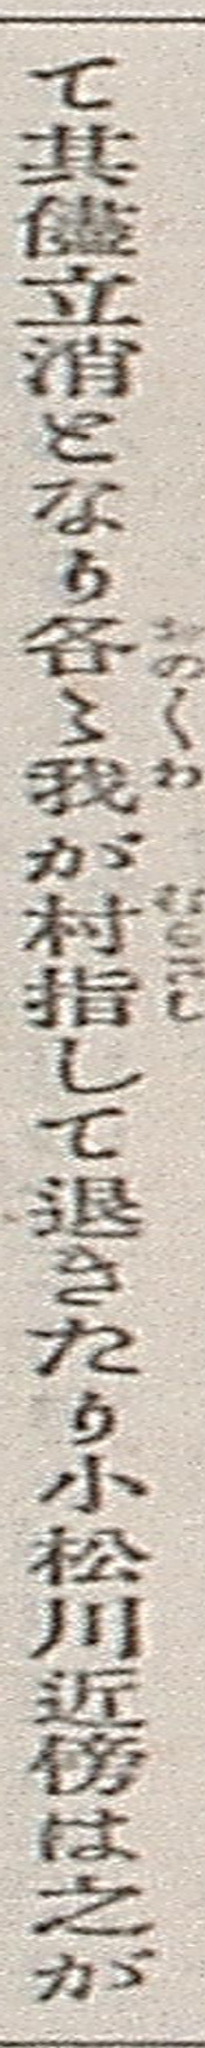て其侭立消となり各々我が村指して退きたり小松川近傍は之が
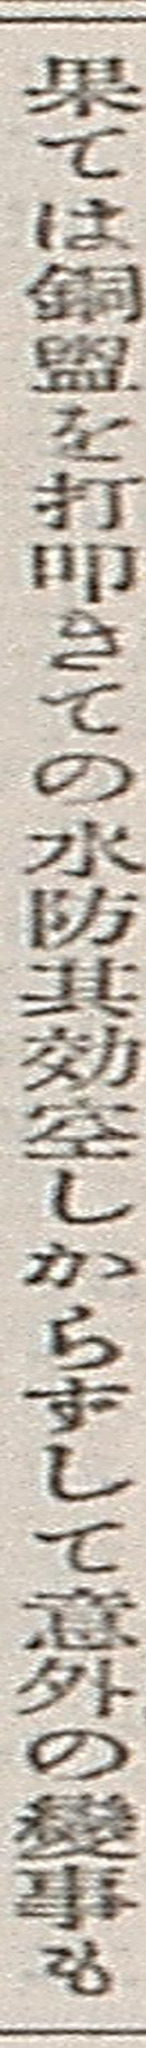果ては銅盥を打叩きての水防其効空しからずして意外の変事も
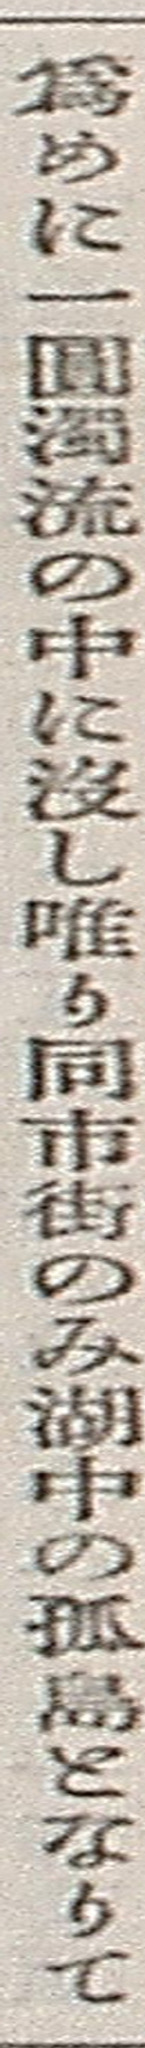為めに一円濁流の中に没し唯り同市街のみ湖中の孤島となりて
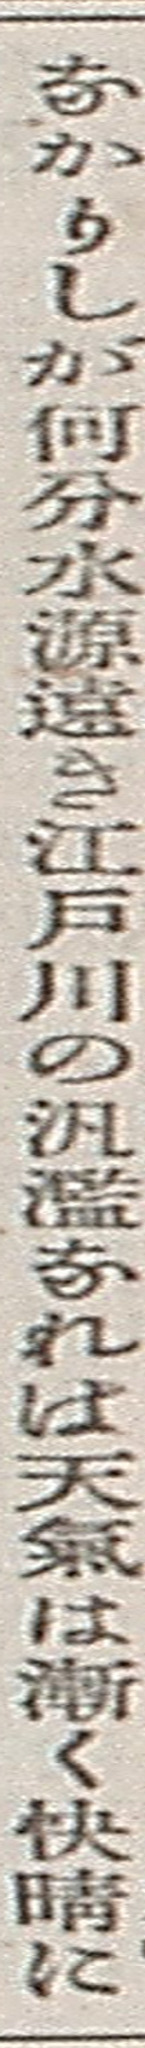なかりしが何分水源遠き江戸川の氾濫なれば天気は漸く快晴に
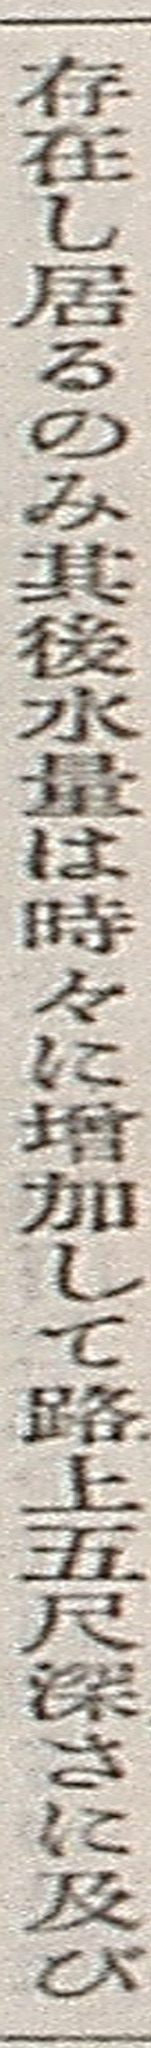存在し居るのみ其後水量は時々に増加して路上五尺深さに及び
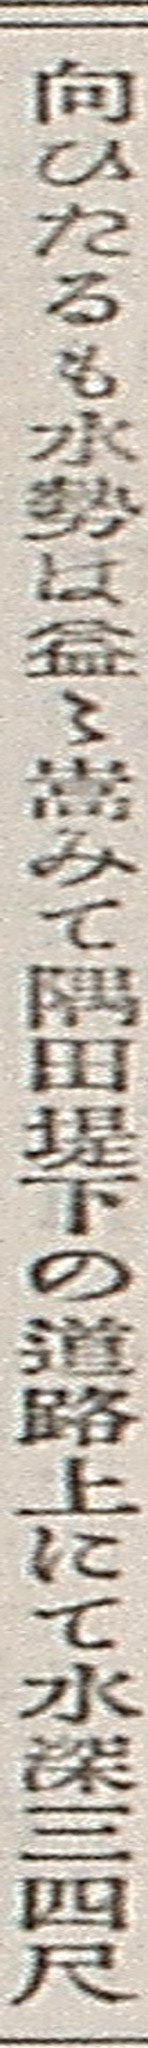向ひたるも水勢は益々嵩みて隅田堤下の道路上にて水深三四尺
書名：風俗畫報臨時増刊第百二十四號　洪水地震被害録（上）
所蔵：東京大学地震研究所図書室 Earthquake Research Institute Library, The University of Tokyo, JAPAN
